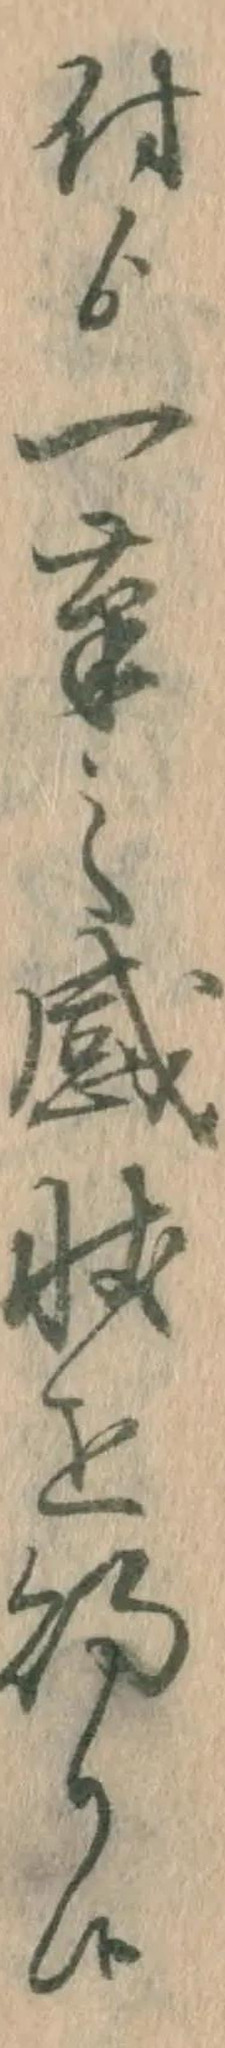付ゟ一筆之感情を賜り候
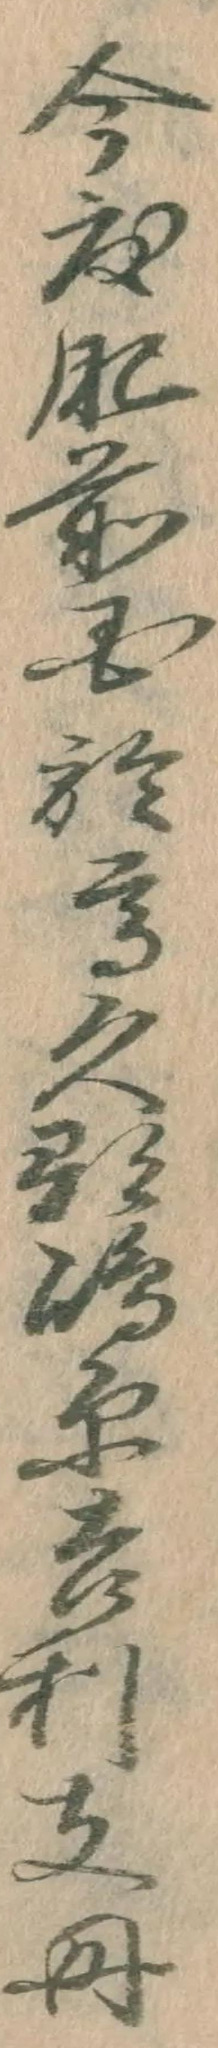今度肥前国於高久顕島原吉利支丹
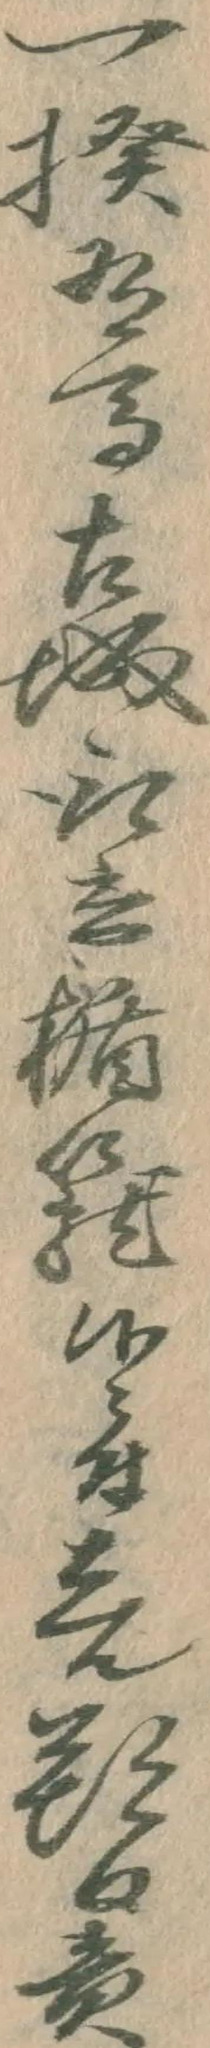一揆有馬古城取去楯籠候に付去る朔日責
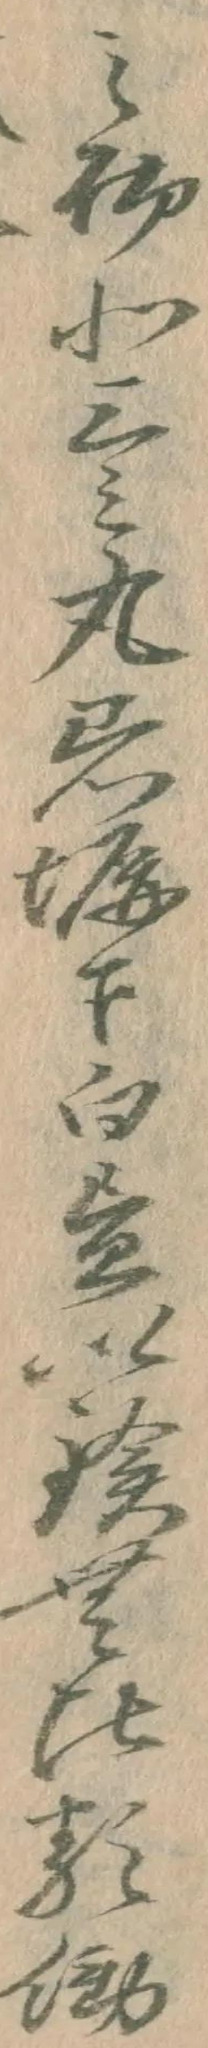之砌北三之丸着塀下白昼以鎗無比類働
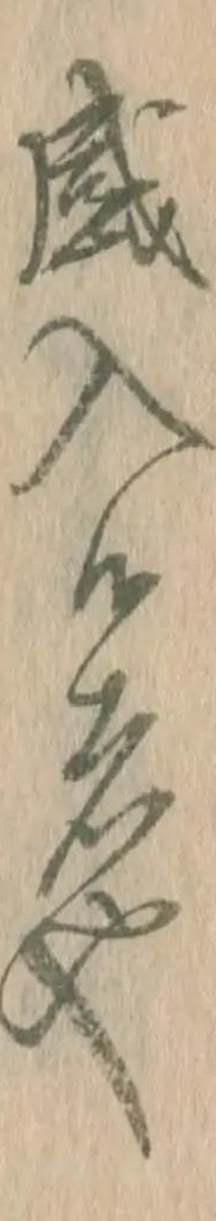感入候者也
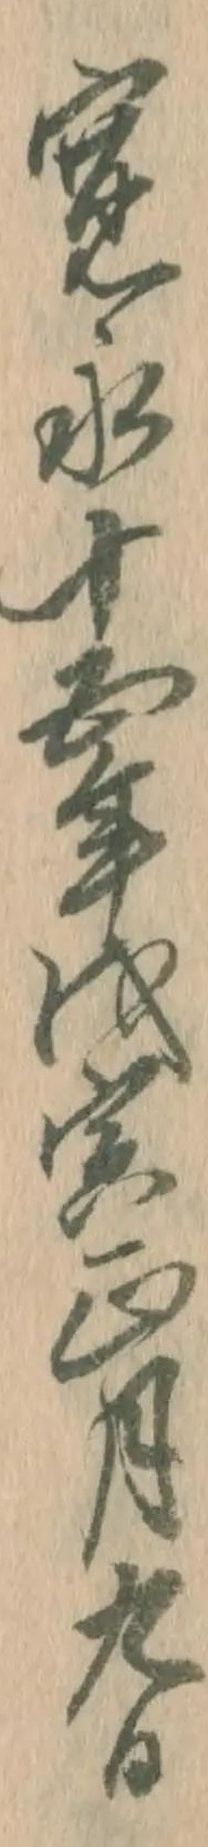寛永十五年戌寅正月九日

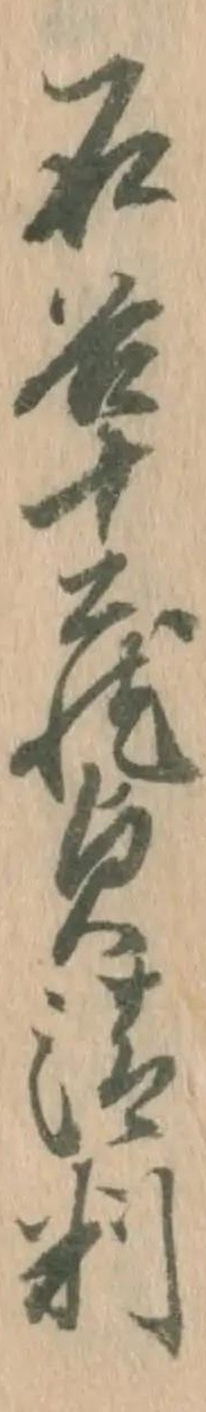石谷十蔵貞清判
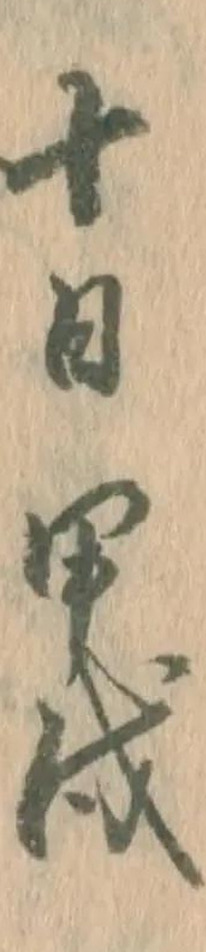十日甲戌
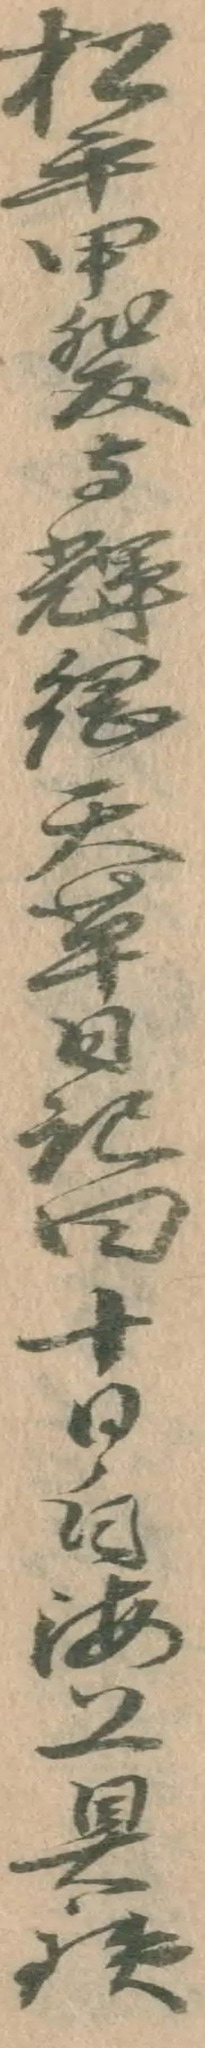松平甲斐守輝綱天草日記曰十日自海上具鉄
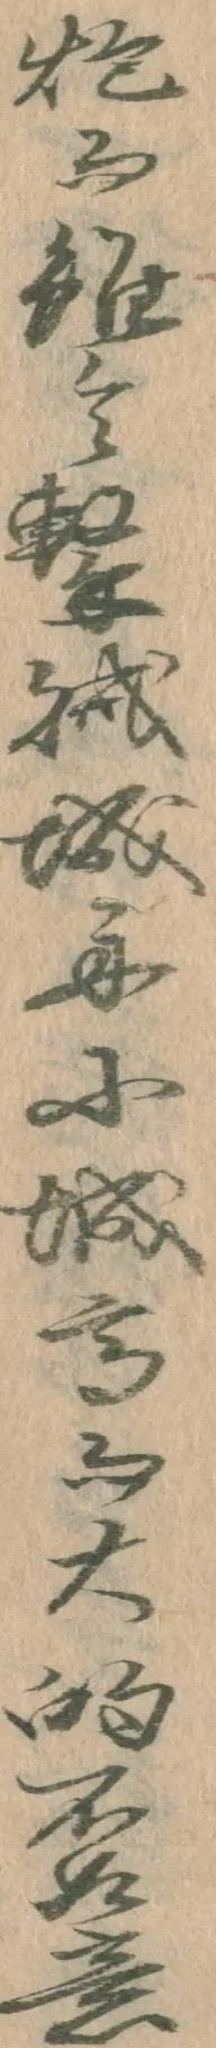砲而雖令撃賊城舟小城高而大的不如意
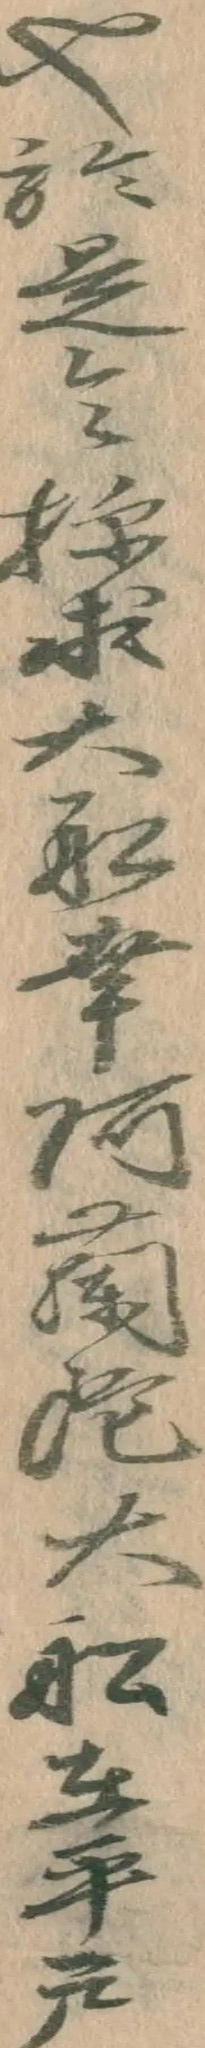也於是れに探求大舩幸阿蘭陀大舩在平戸
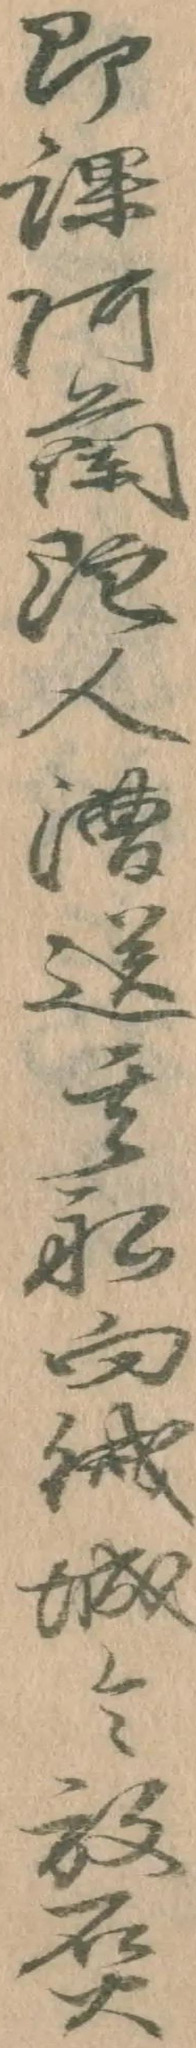即課阿蘭陀人漕送其舩向賊城令放石火
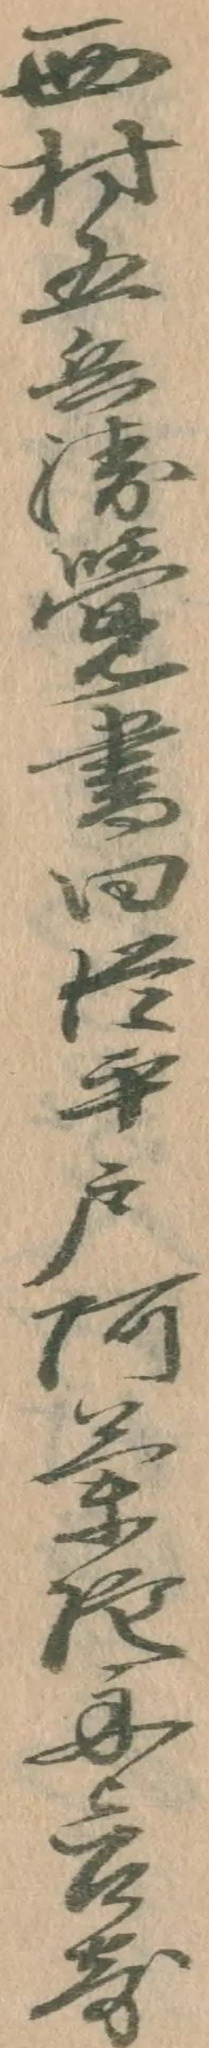西村五兵衛覚書曰従平戸阿蘭陀舟被召寄
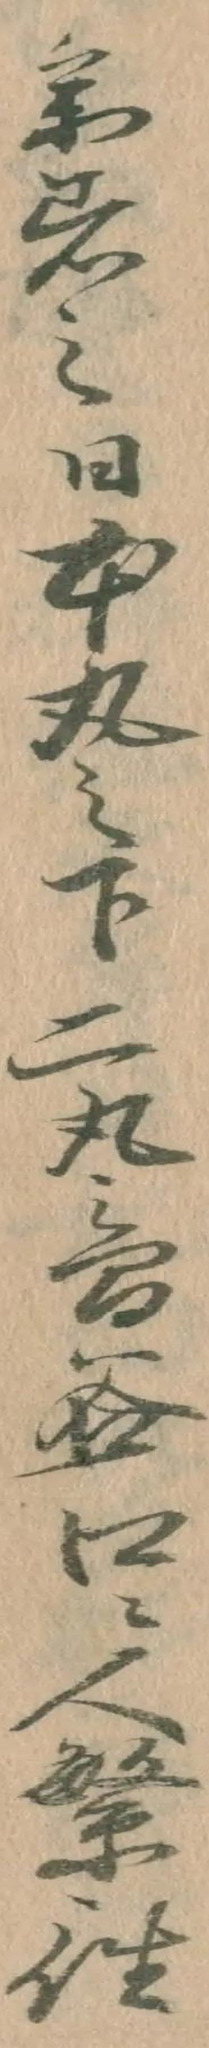参着之日本丸之下二丸之間谷口に人繁往
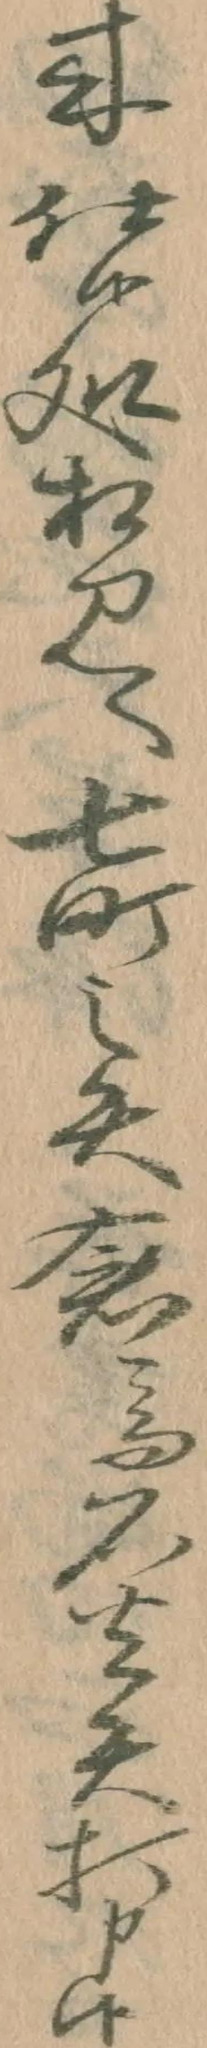来仕候処相見へ七町之矢倉に而石火矢打申候
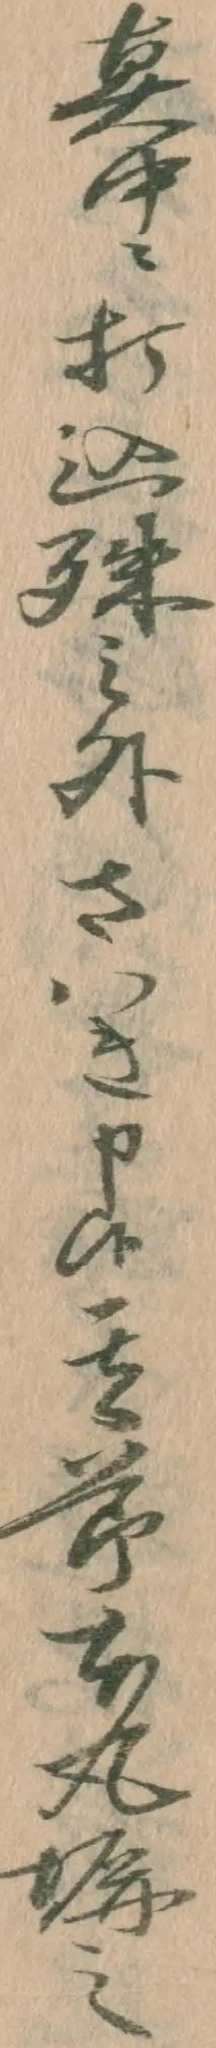真中に打込殊之外さはき申候其節本丸塀之
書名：切支丹御退治記 49巻. [5]
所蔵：国立国会図書館 National Diet Library, JAPAN
